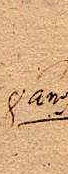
8 an̄os
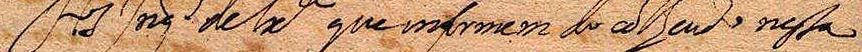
Aos Jnqres de lxa que informem do cōtheudo nesta
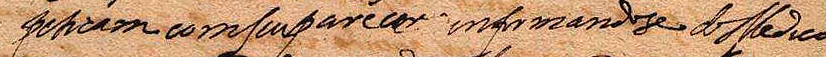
petiçam com seu parecer informandose do Medico
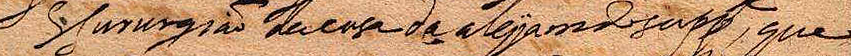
E sururgiaõ da casa da alejjam do suppte, que
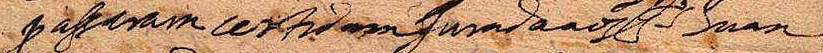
passaram certidam jurada aos stos Euan
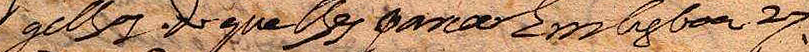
gelhos do que lhes parecer Em lisboa 27
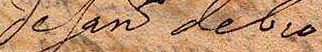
de Janro de 610
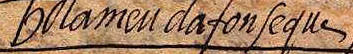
b̄olameu da fonsequa
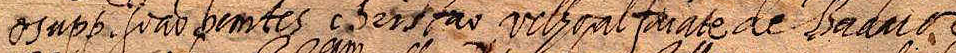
o supp.te Joaõ benites christaõ velho, alfaiate de Badaioz
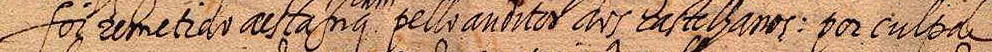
foi remetido a esta Inqçam pello auditor dos castelhanos: por culpa
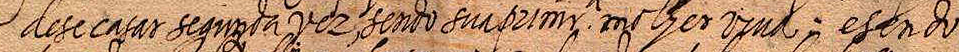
de se casar segunda vez, sendo sua primr.a molher viua, e sendo
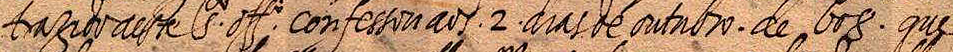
trazido a este s.to offo. confessou aos .2. dias de outubro. de 608. que
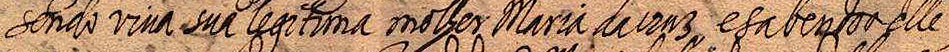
sendo viua sua legitima molher maria da cruz, e sabendoo elle,
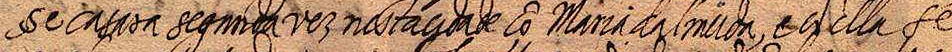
se casara segunda vez nesta cidade cō maria dalmeida, e q̄ ella se
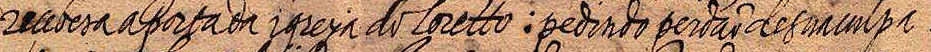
recebera a porta da igreya do loretto pedindo perdaõ de sua culpa.
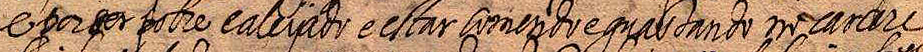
e por ser pobre e aleijado e estar comendo e gastando no carcere
